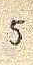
5
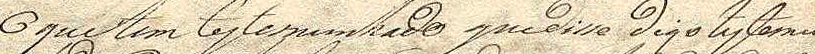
O que tem testemunhado que disso digo testemu
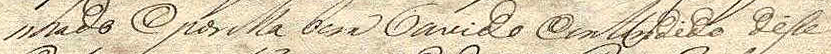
nhado e por ella bem Ouvido e entendido disse
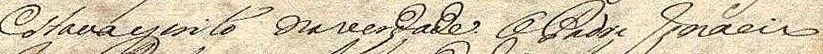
estava escrito na verdade. O Padre Ignacio
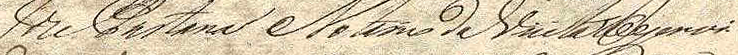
Joze Pastana Notario da Visita o escrevi
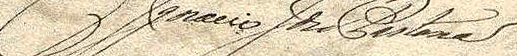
O Jgnacio Joze Pastana
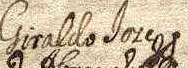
Giraldo Ioze
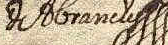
dAbraneles
